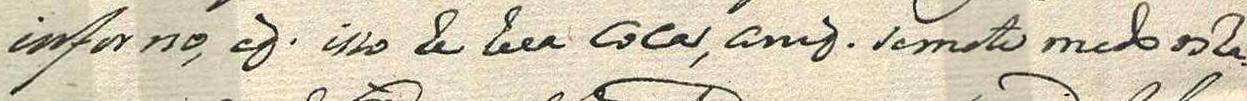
inferno, e q̄. isto he hua Coca, com q̄ se mete medo os Ra
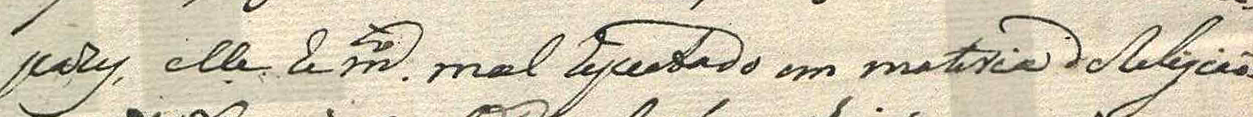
pazes, elle he m.to mal Reputado em materia de Religiaõ
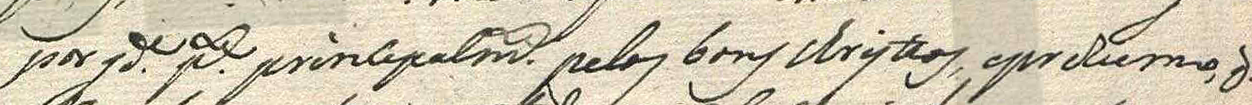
por gd.e p.te principalm.te pelos bons christaos, e prezumo, q̄
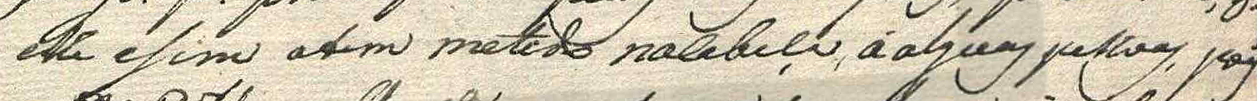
elle asim a tem metido na cabeça, á alguas pessoas, pois
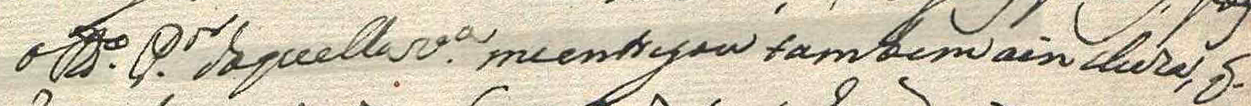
o Rd.o P.or daquella V.a me entregou tambem a incluza, q̄
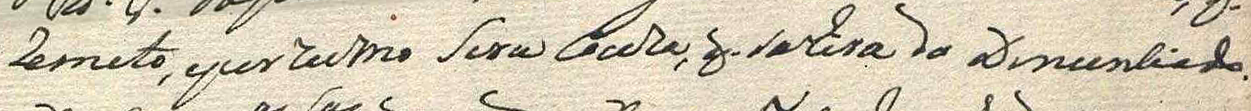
Remeto, e perzumo sera Couza, q̄ sahira do Denunciado.
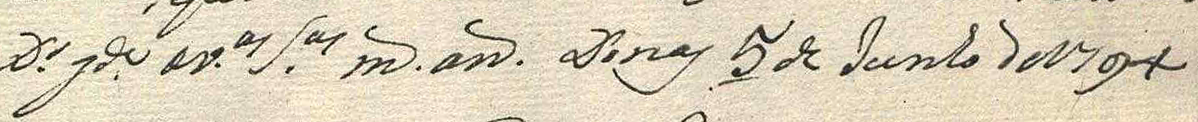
D.s g.de a v.as S.as m̄. an̄. Donas 5 de Iunho de 1794
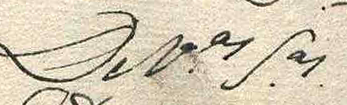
De V.as S.as
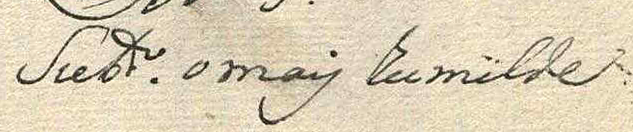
Sub̄.o o mais humilde
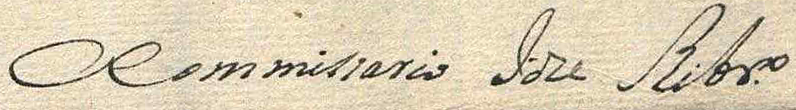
O Commissario Ioze Ribr.o
